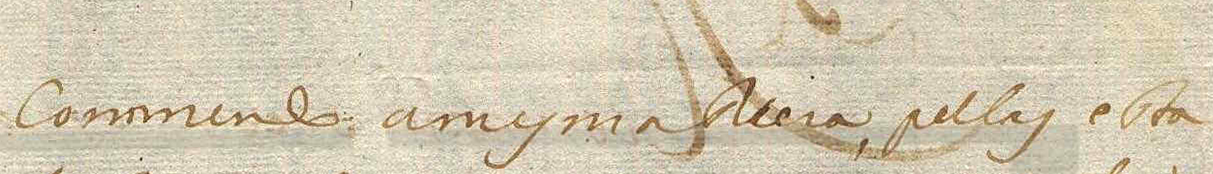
commendo a mesma Meza, pellas esta
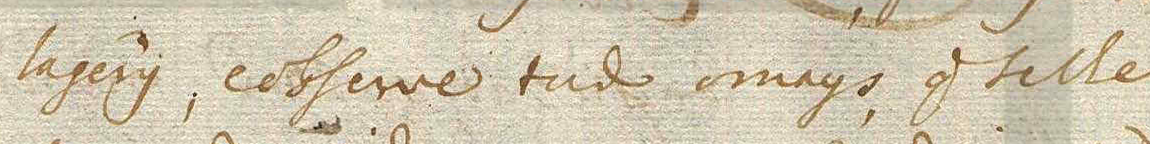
lagen̄s, e observe tudo o mays, q̄ se lhe
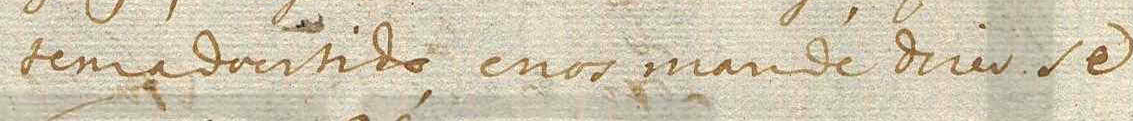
tem advertido, e nos mande dizer se
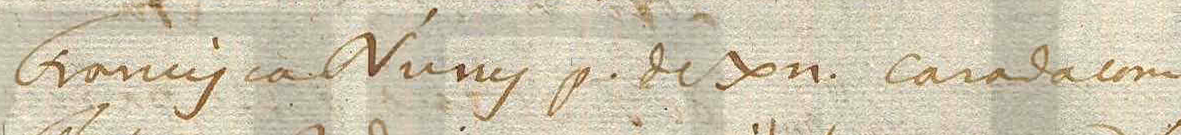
Francisca Nunes p. de x n. cazada com
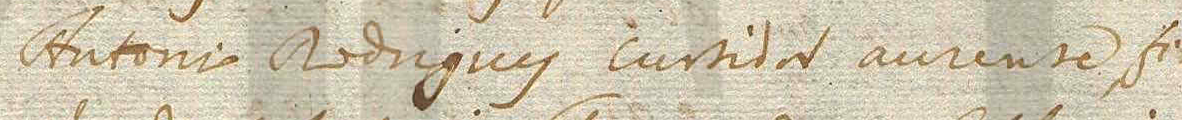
Antonio Rodrigues curtidor auzente, fi
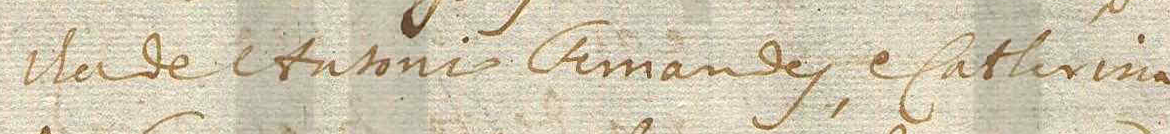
lha de Antonio Fernandes, e Catherina
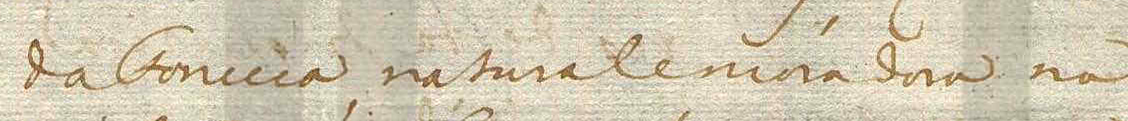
da Fonceca, natural e moradora na
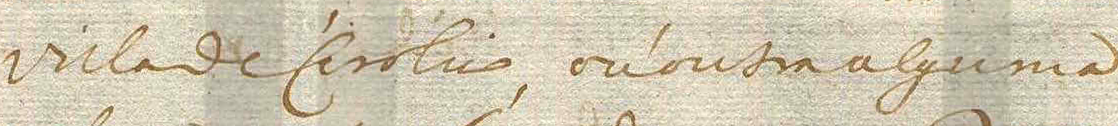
villa de Cerolico, ou outra alguma
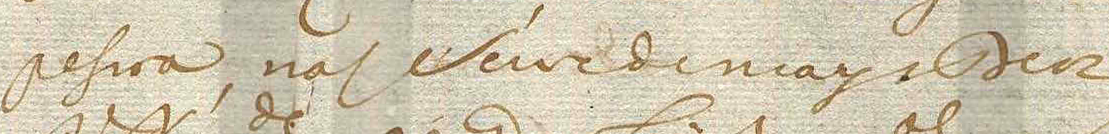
pessoa naꝭ serve de mais Deoz
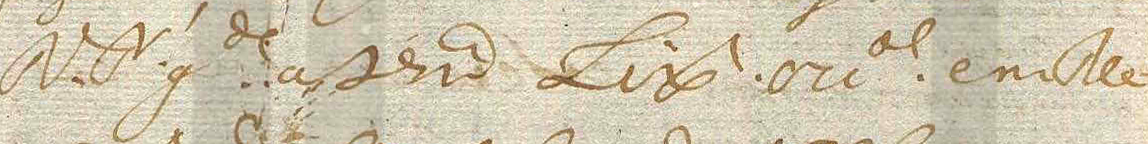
N. Sr. g.de a V m.ce Lix.a occ.al em Me
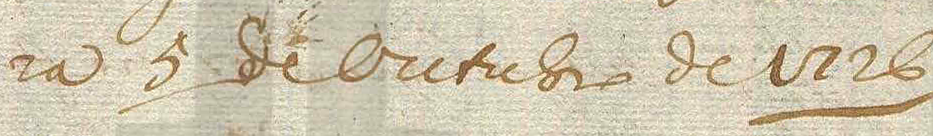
za 5 de Outubro de 1726
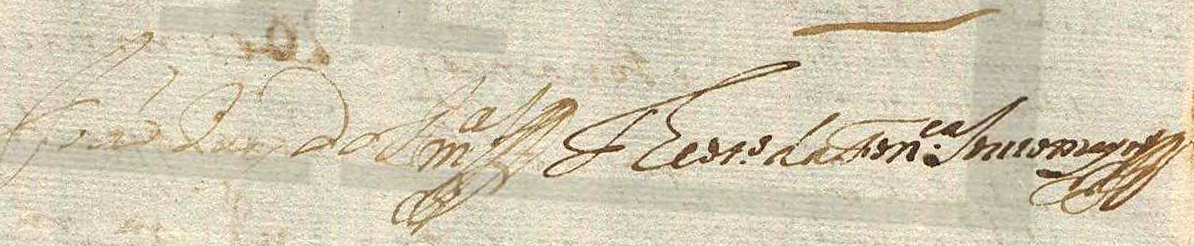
Joaõ Pais do Am.al Theot.o da Fon.ca Soutomayor
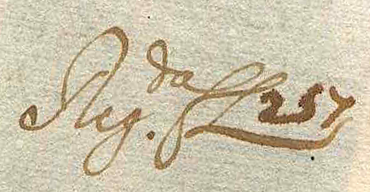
Reg.da fL 257
